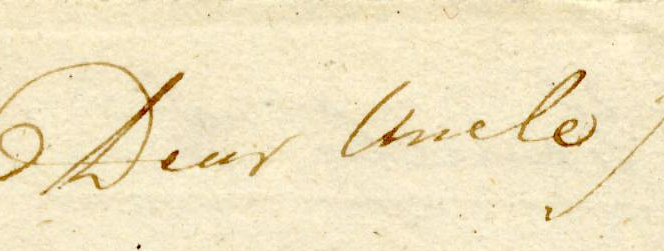Dear Uncle
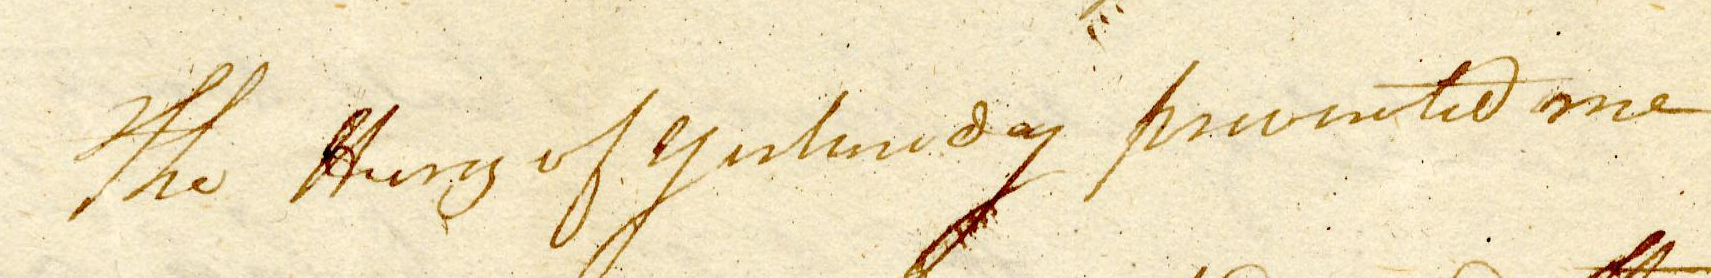The Hury of yesterday prevented me
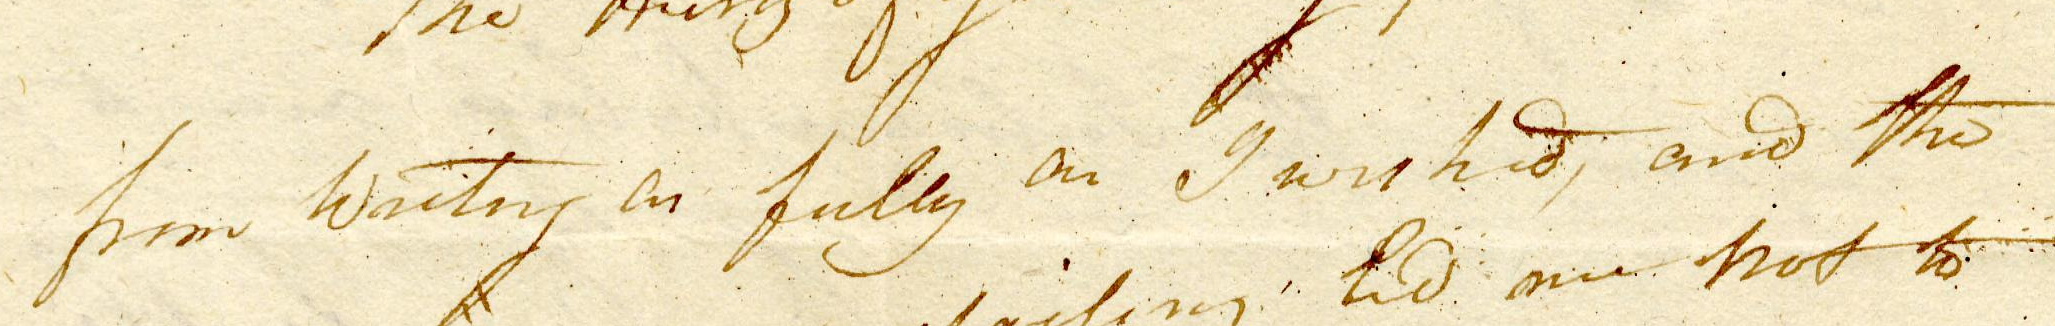from Writing as fully as I wished, and the
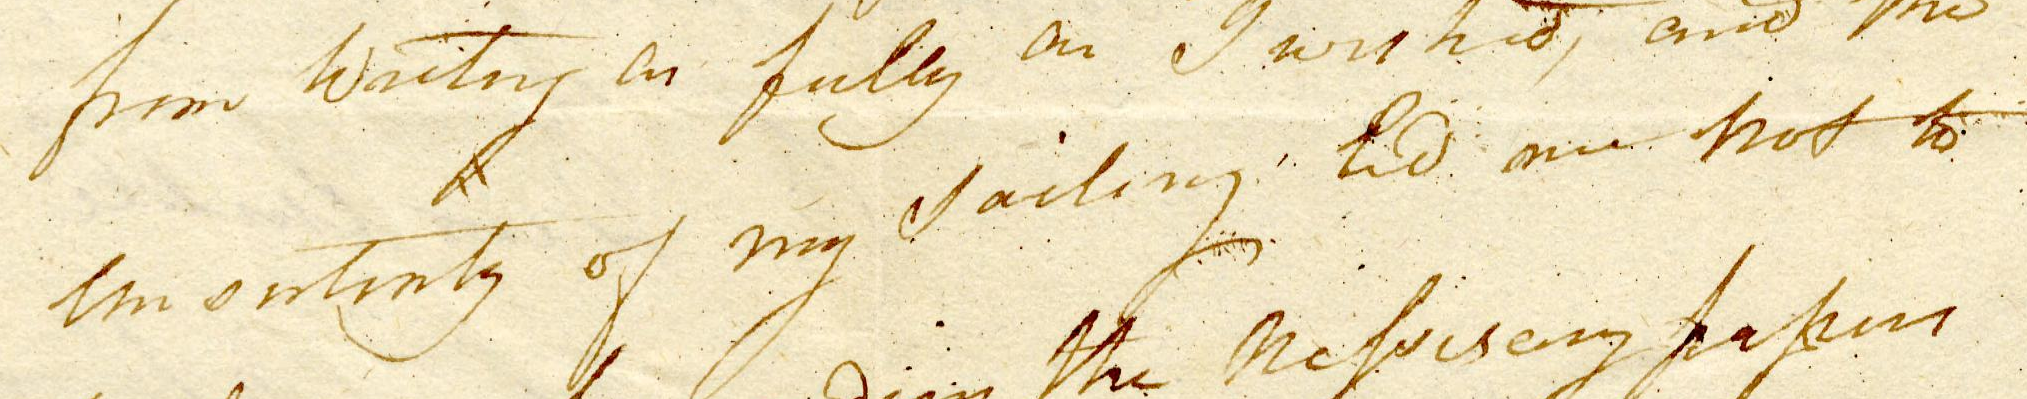inormity of my sailing: had me not to
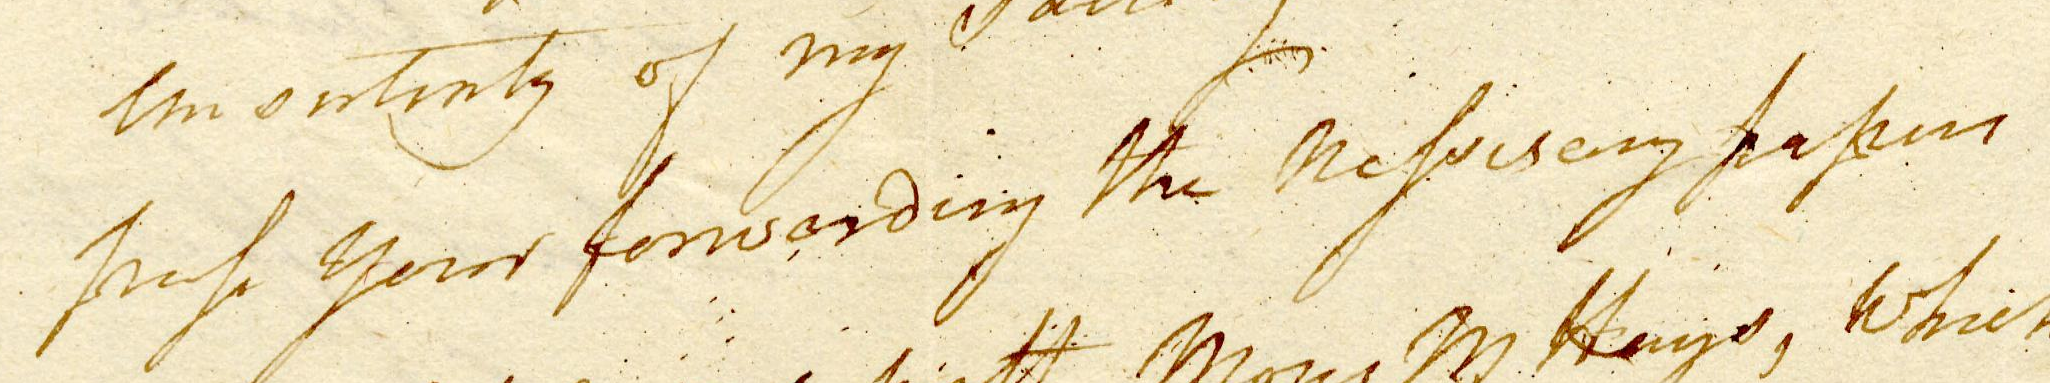press your forwarding the nessesery papers
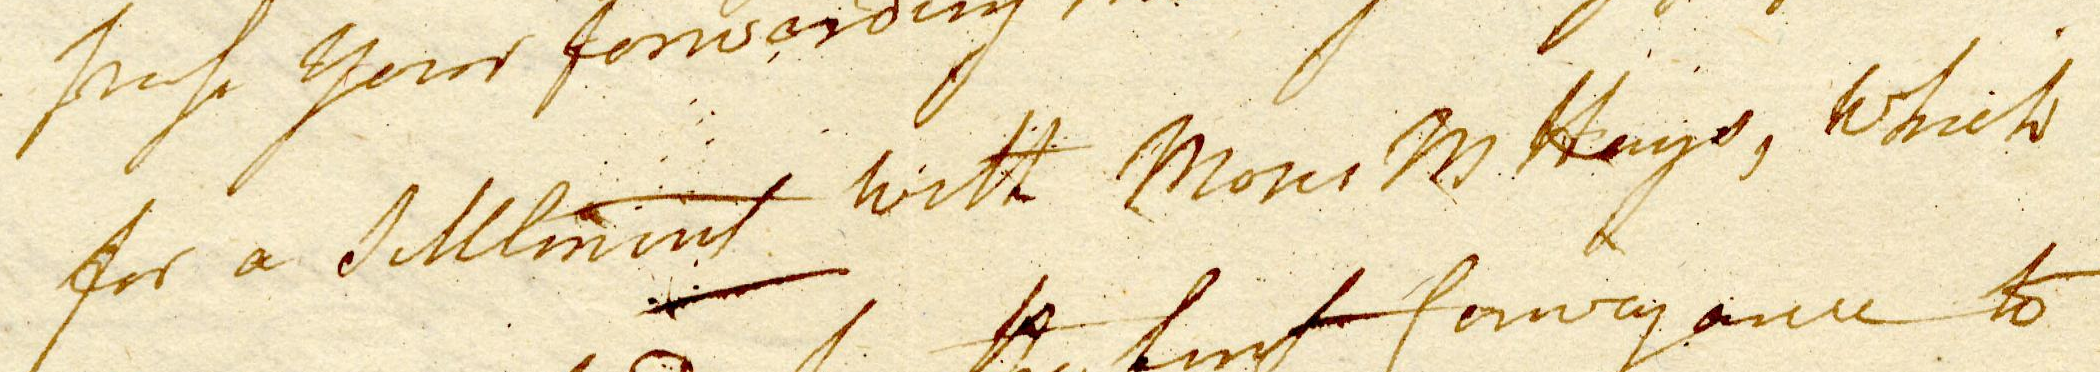for a Settlemint with Moses M Hayes, Which
